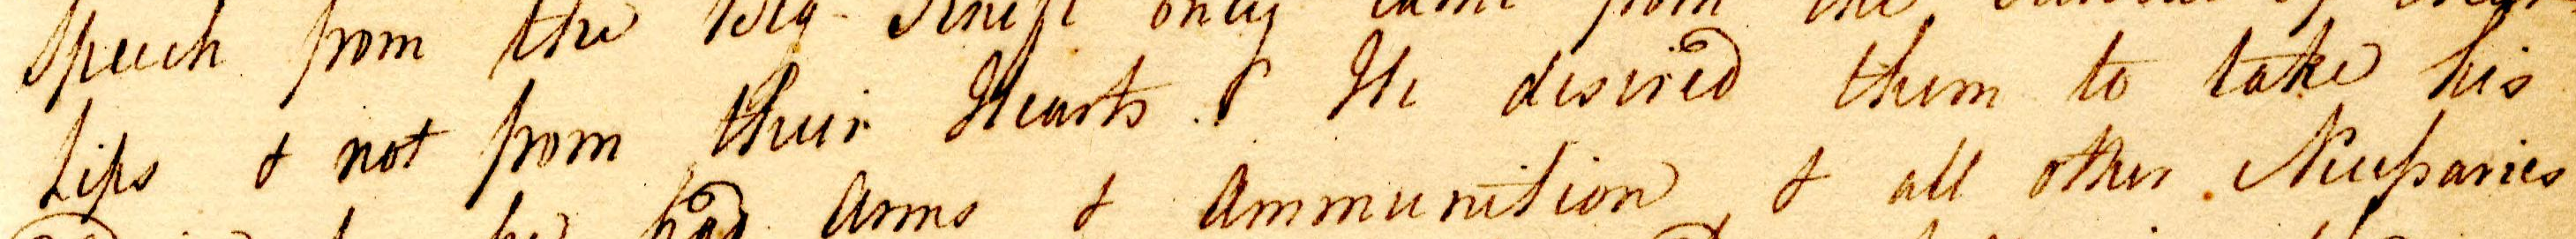Lips & not from their Hearts & He desired them to take his
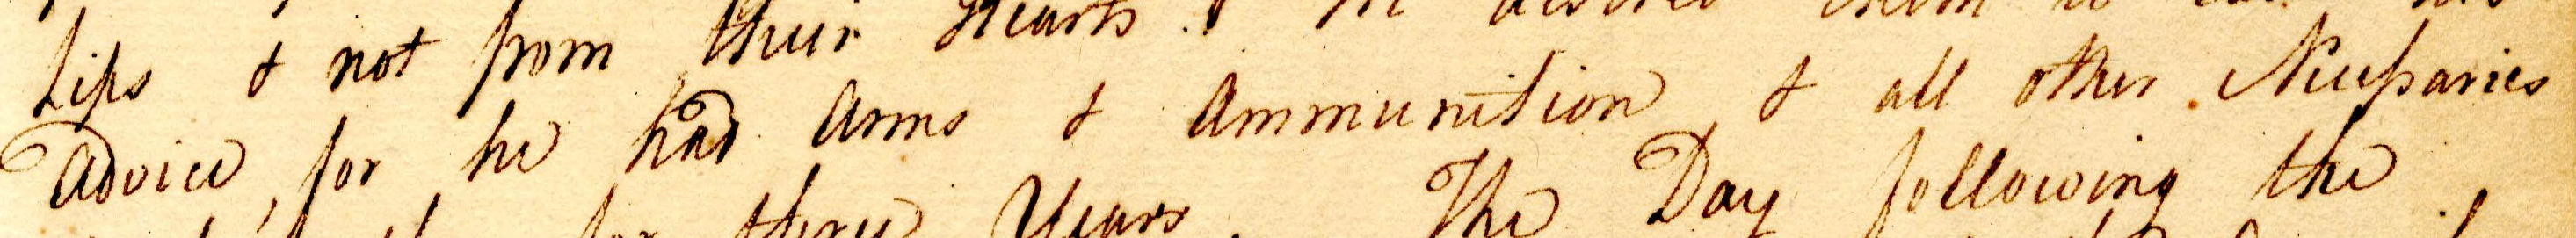Advice for he had Arms & Ammunition & all other Necessaries
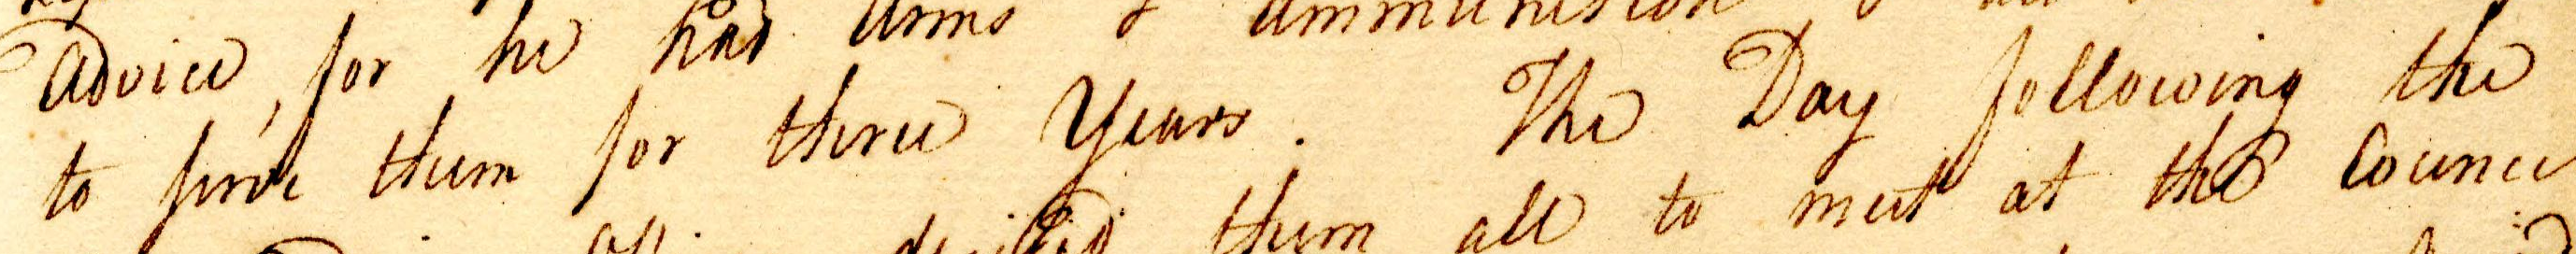to serve them for three Years. The Day following the
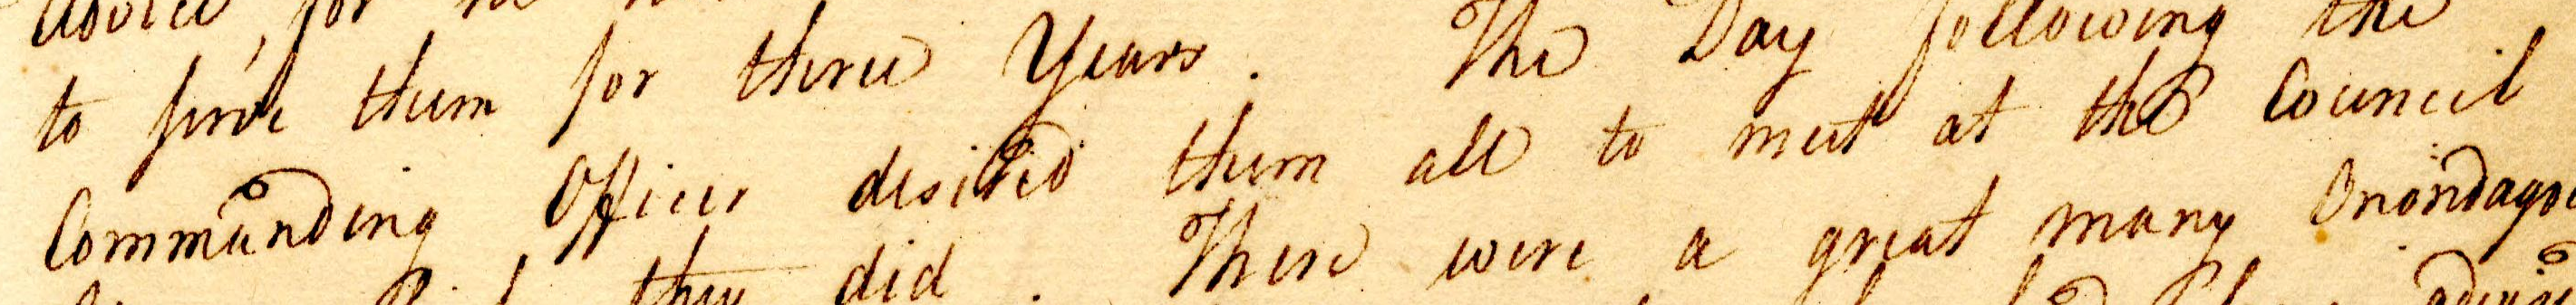Commanding Officer desired them all to meet at the Council
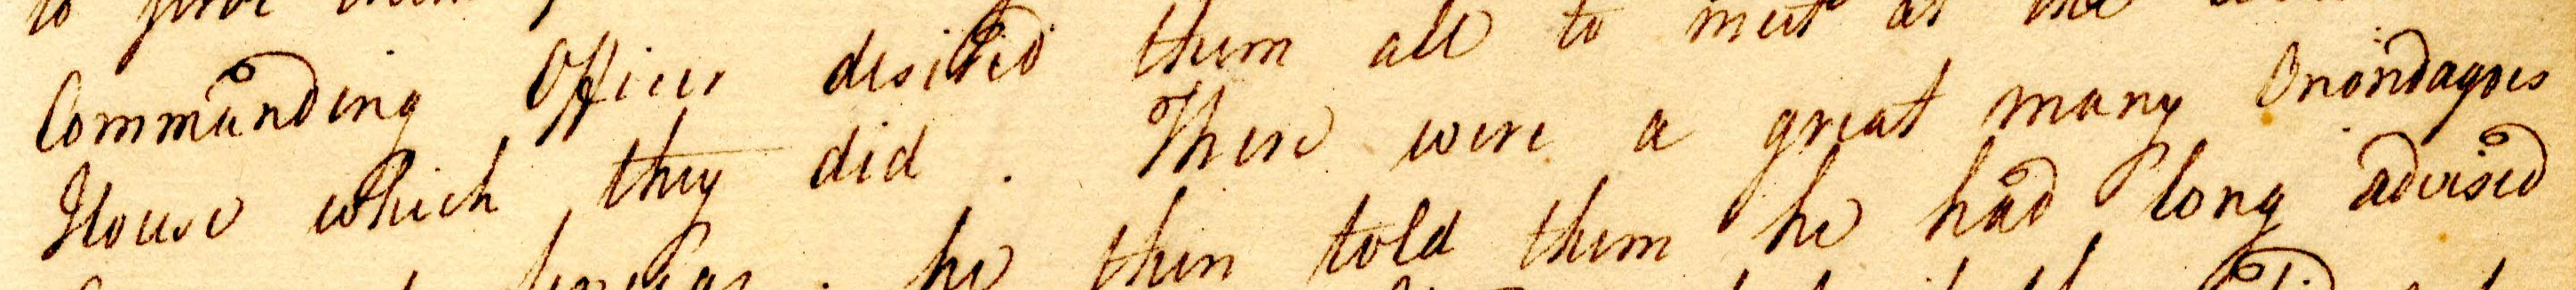House which they did. There were a great many Onondagoes
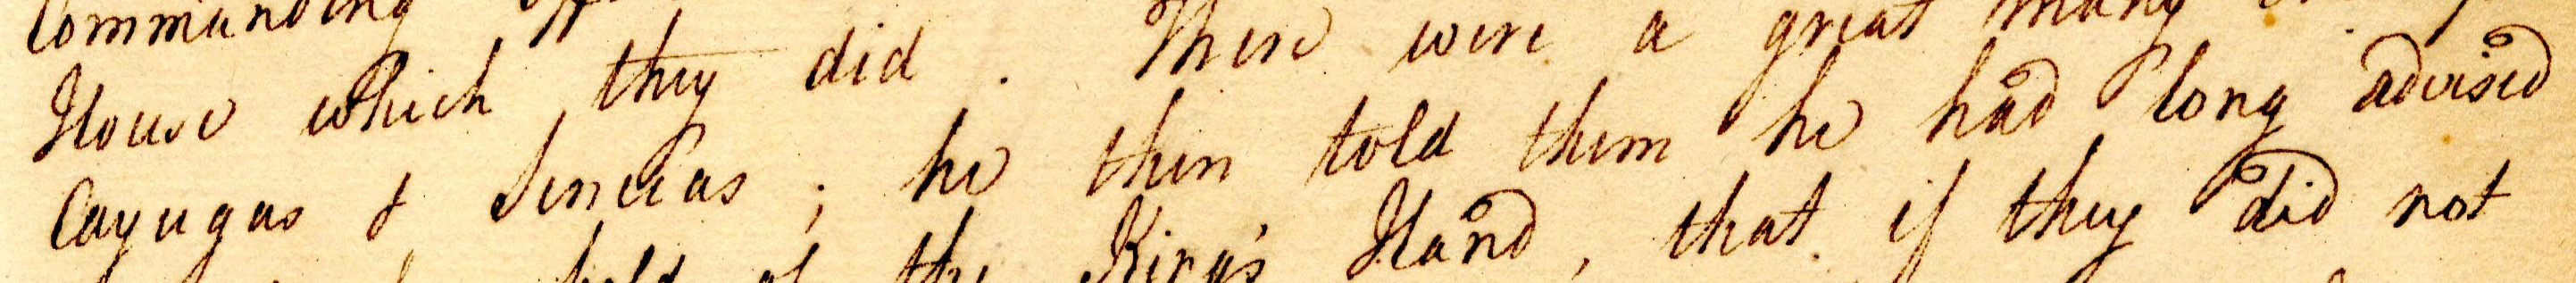Cayugas & Senecas; he then told them he had long advised
